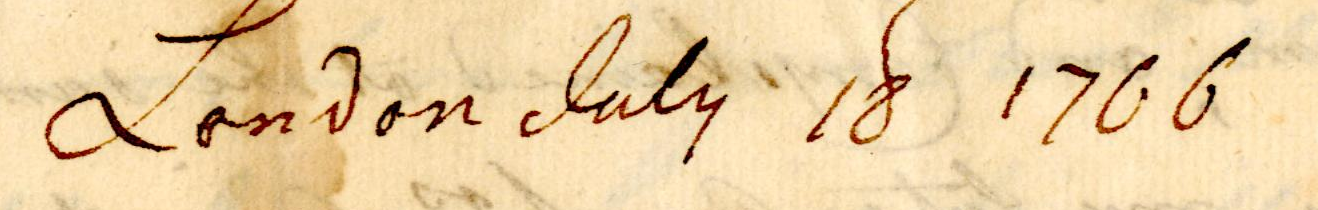London July 18 1766
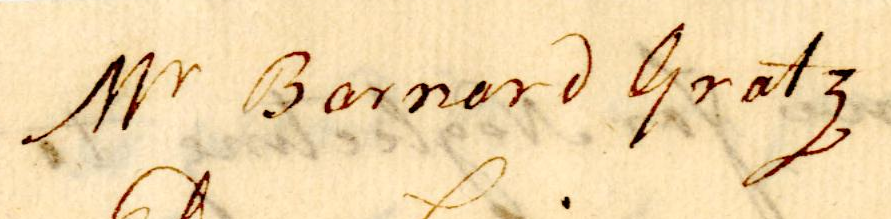M^r. Barnard Gratz
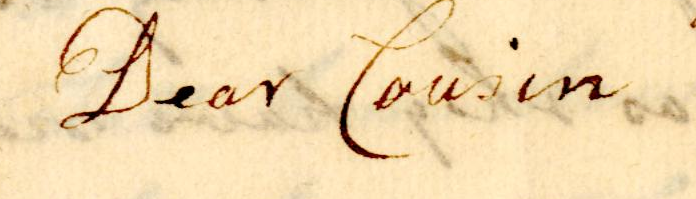Dear Cousin
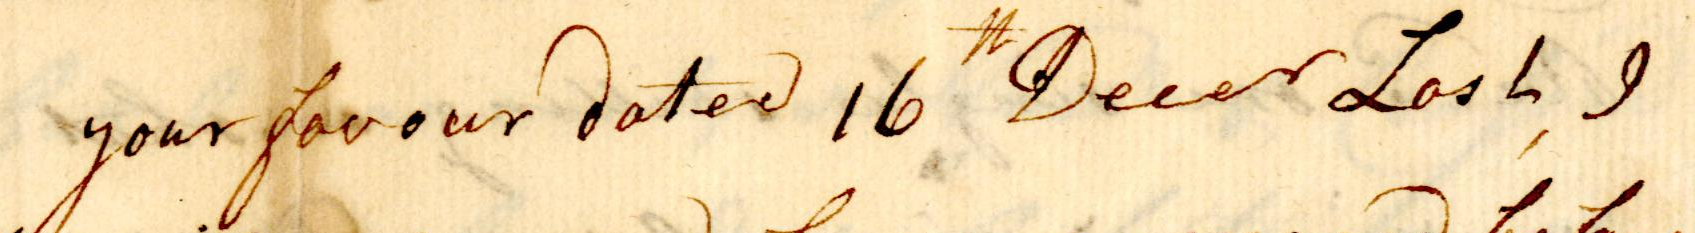your favour dated 16^th Dece^r Last, I
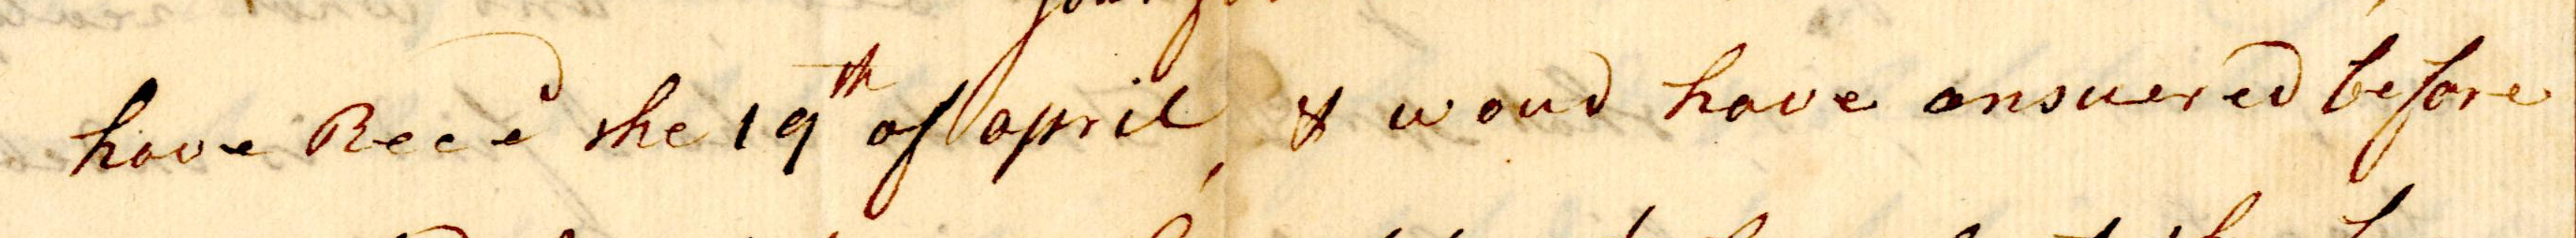have Rece^d the 19^t. of April, & would have Answered before
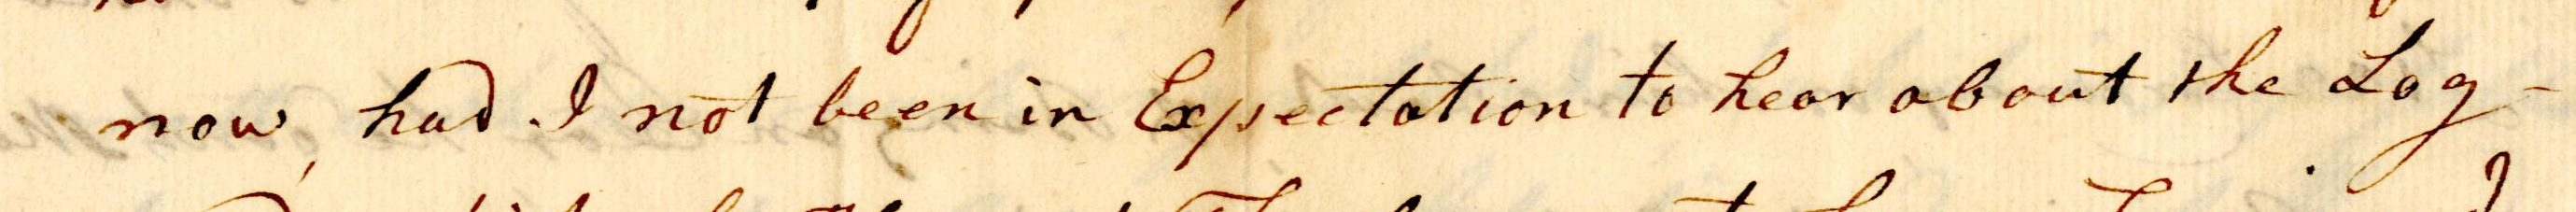now, had I not been in Expectation to hear about the Log
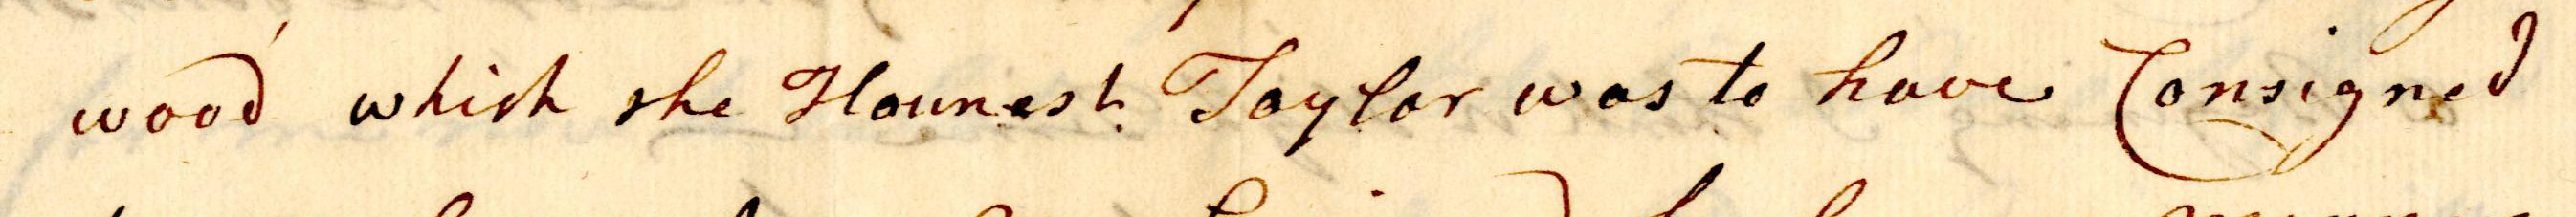-wood which the Hounest Taylor was to have Consigned
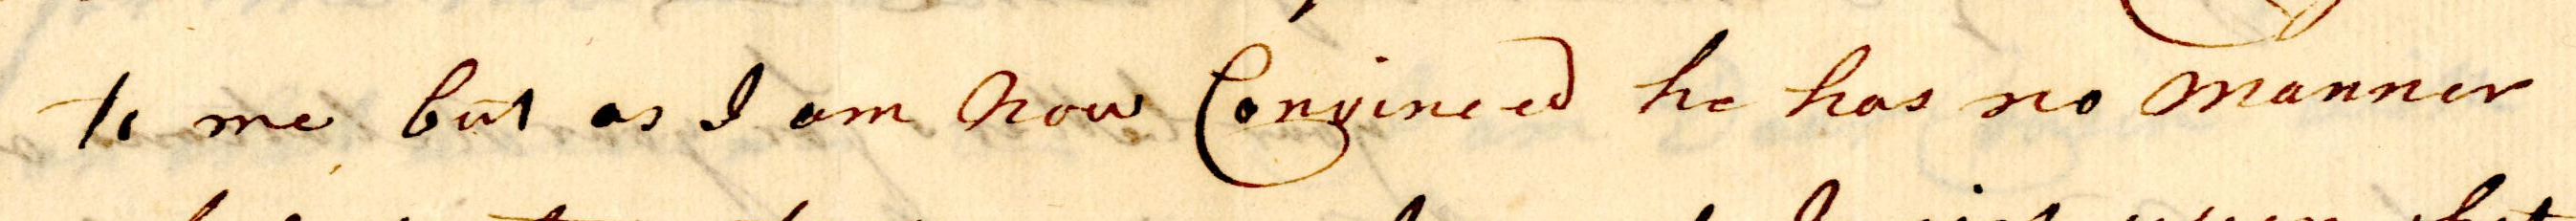to me but as I am now Convinced he has no manner
